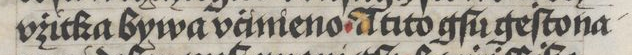vžitka bywa vċinieno.Atito gſu geẛto na
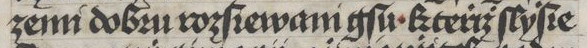zemi dobru rozſiewani gſu.kteṙiż ſlyẛie
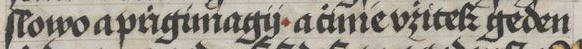ſlowo a pṙigimagi.a ċiníe vżitek geden
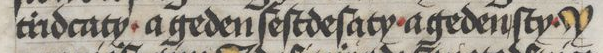tṙidcaty.a geden ſeſtdeſtty.a geden ſty.Y
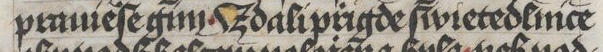prauíeẛe gim.Zdali pṙigde ſwietedlníce
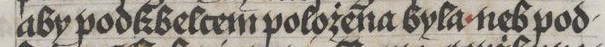aby podkbelcem polożena byla.neb pod¬
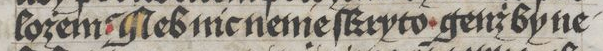lożem Neb nic nenie ſkryto.genż by ne¬
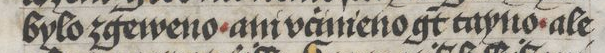bylo zgeweno.ani vċineto ḡt tayno.ale
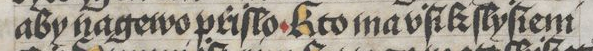aby nagewo pṙiẛlo.Kto ma vẛi ſlyẛieni
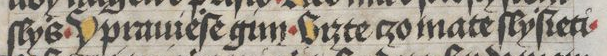ſlyṡ.A prauíeẛe gím.Vizte czo mate ſlyẛieti.
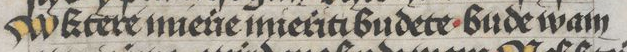W které mieṙie mieṙie budete.bude wam
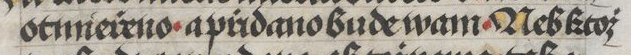otmíeřeno.a pṙidano bude wam.Neb ktoż
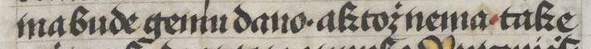ma bude gemu dano.a ktoż nema.také
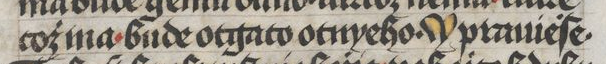coż ma.bude otgato ot nyeho. A prauíeẛe.
